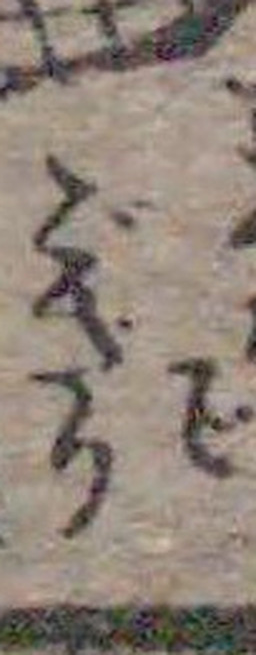ござり
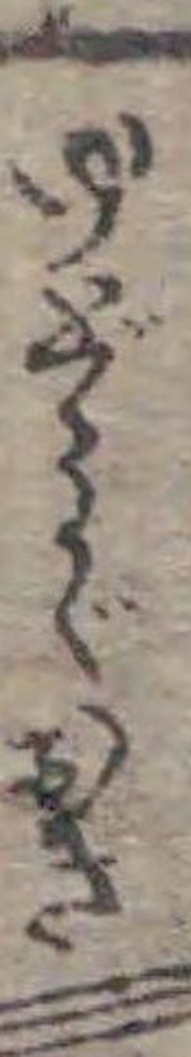ゆどうぐおき
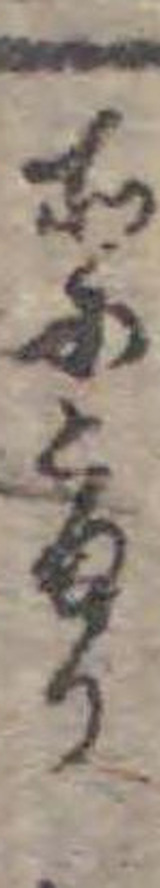所にこまり
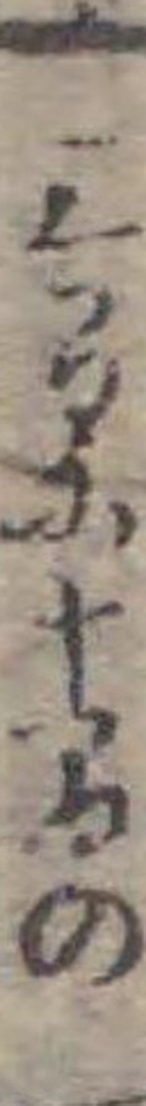三間に十間の
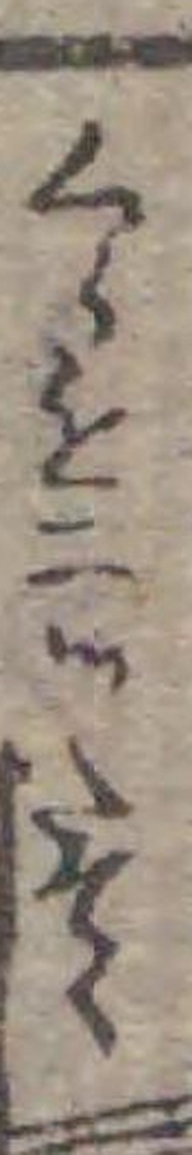くらを二ツたてゝ
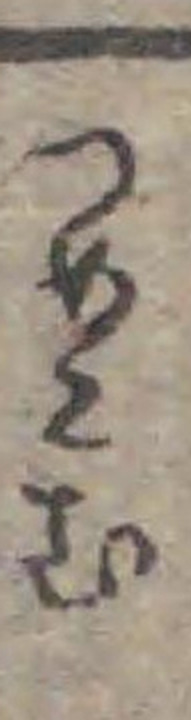つめこむ

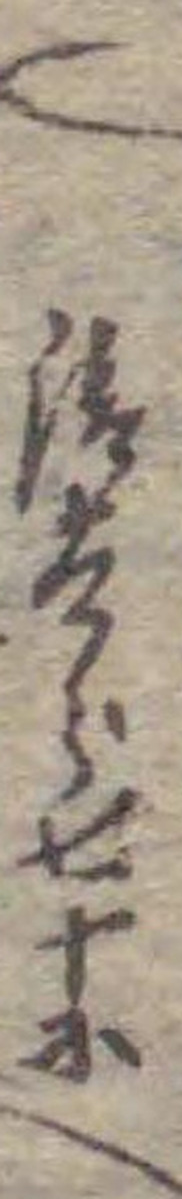清太郎七十に
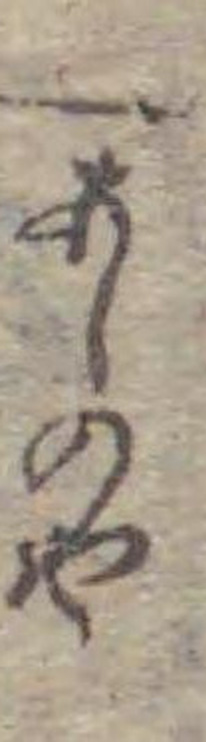あしのや
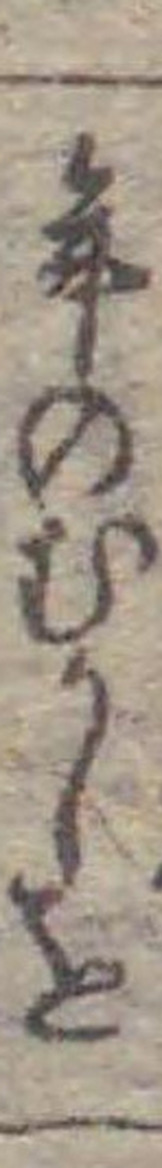年のむかしを
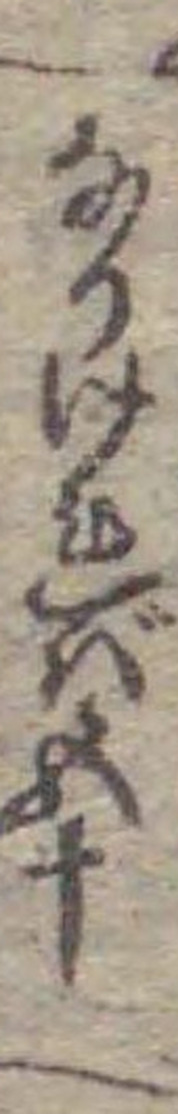なりければ五十
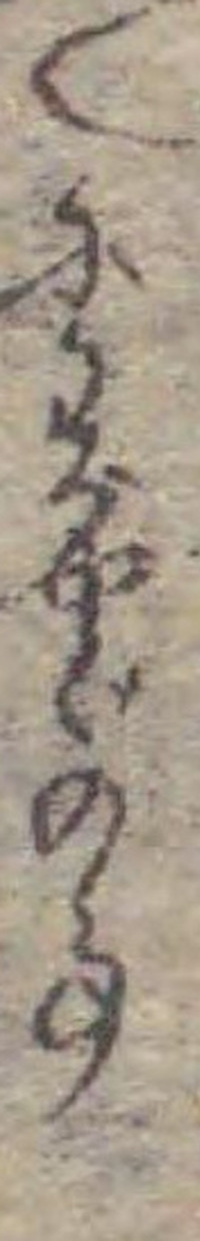にわがやどの事
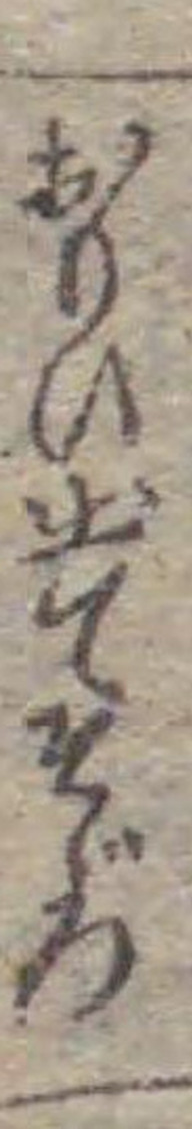おもひ出てそゞろ
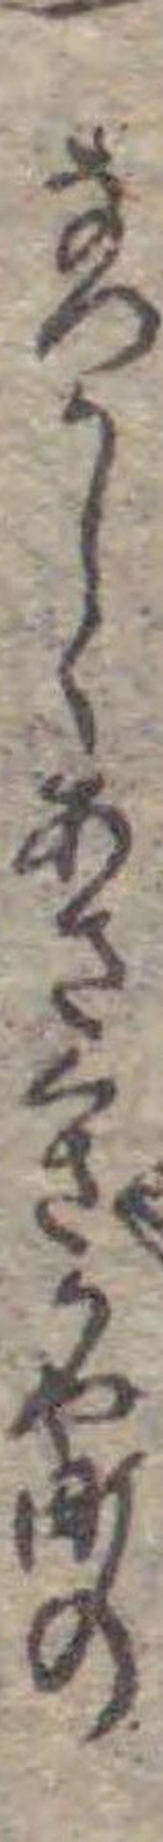なつかしくあさくさかや町の
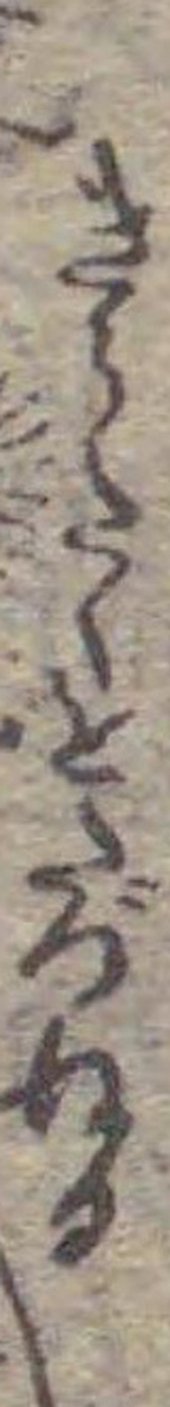きうたくをたづねる

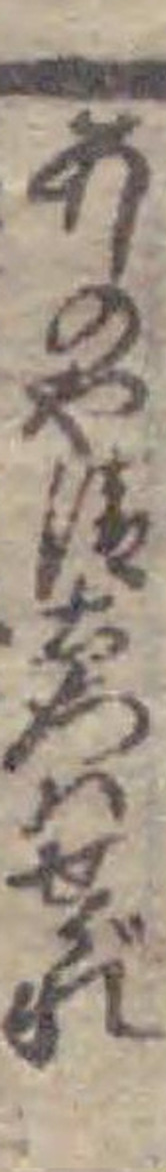あしのや清右衛門はせがれ
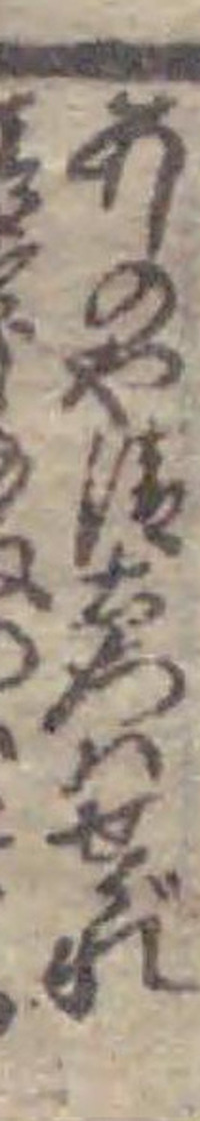あしのや清右衛門はせがれ
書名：見徳一炊夢 : 3巻
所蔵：国立国会図書館 National Diet Library, JAPAN
